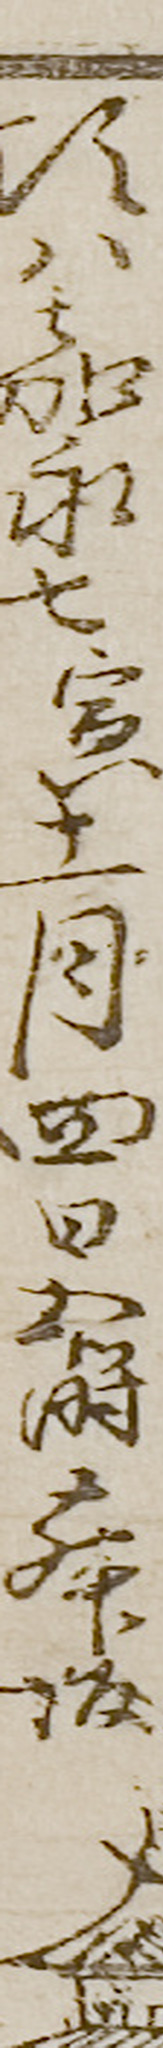頃は嘉永七寅十一月四日五つ時舞坂
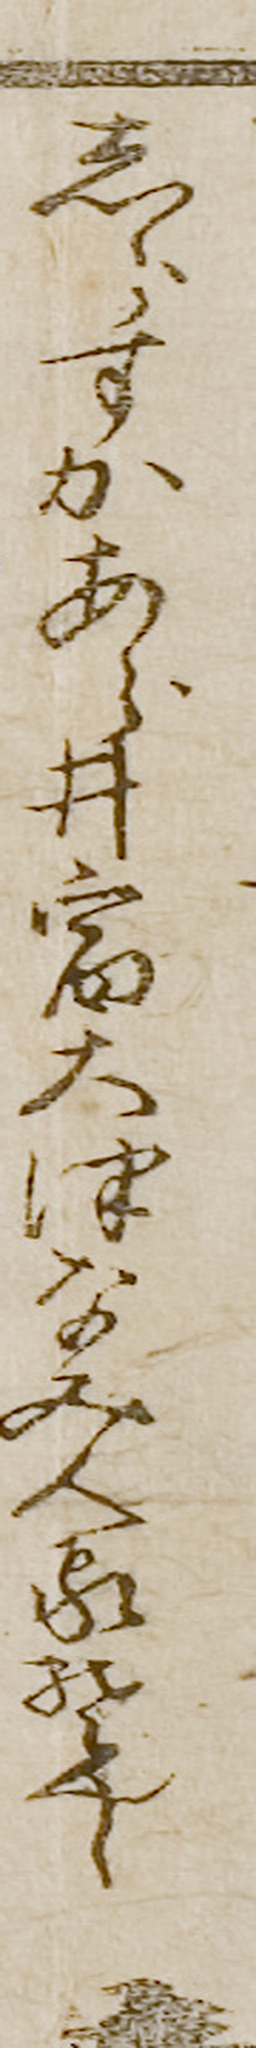しらすかあら井宿大津なみ人家そんし
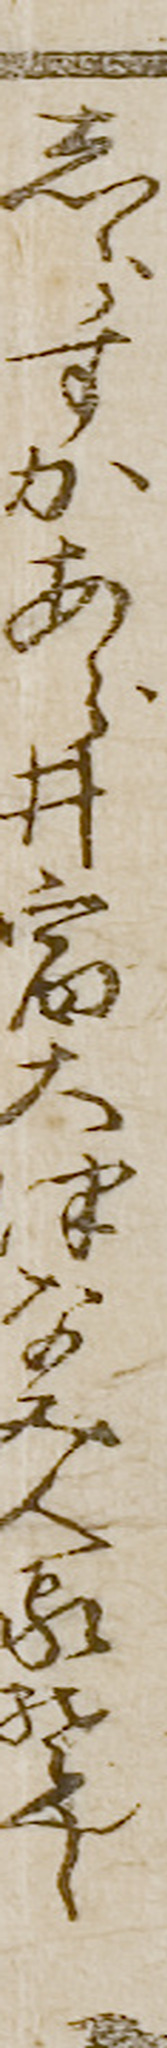しらすかあら井宿大津なみ人家そんし
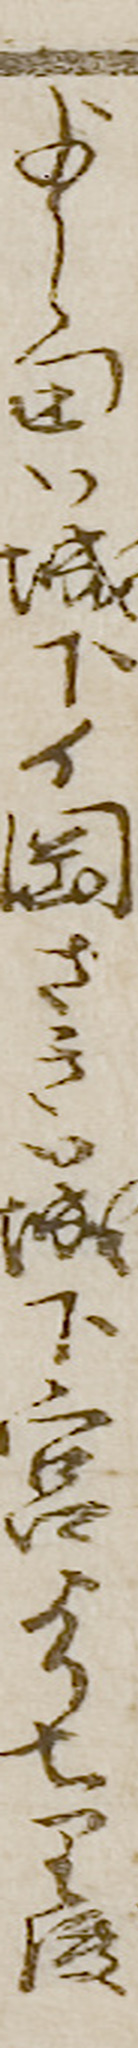よし田御城下より岡さき御城下宮より七里渡
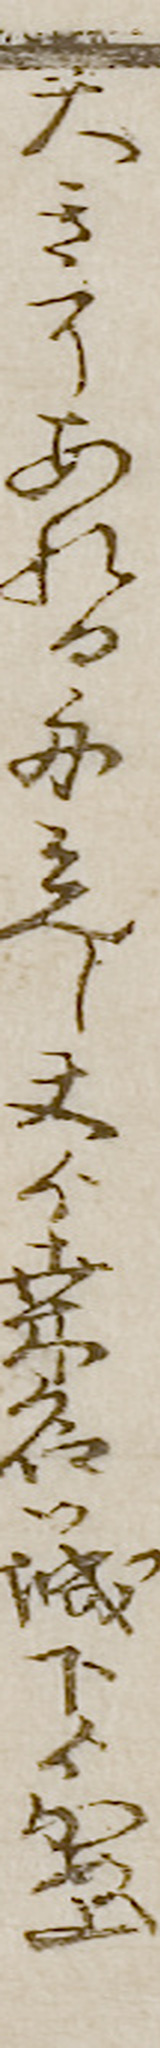大きにあれる舟そんし夫より桑名御城下よりかめ山
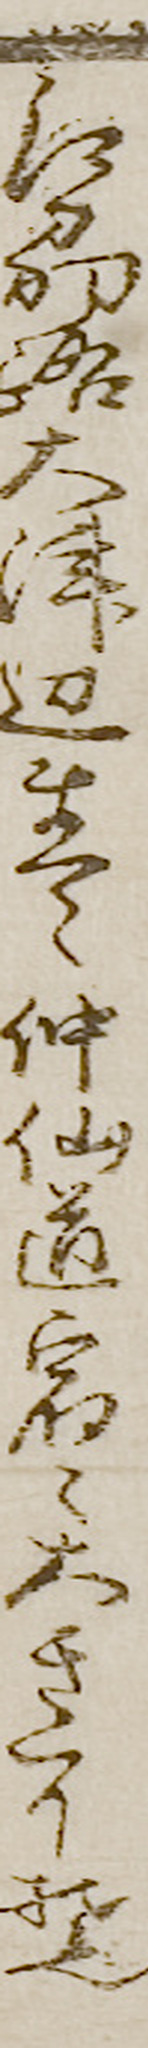江州路大津辺まて仲仙道宿々大きにそん
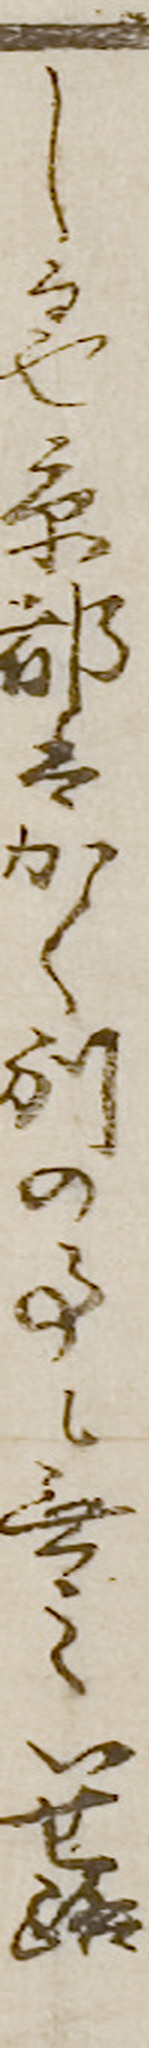しる也京都はかく別の事も無くいせ路
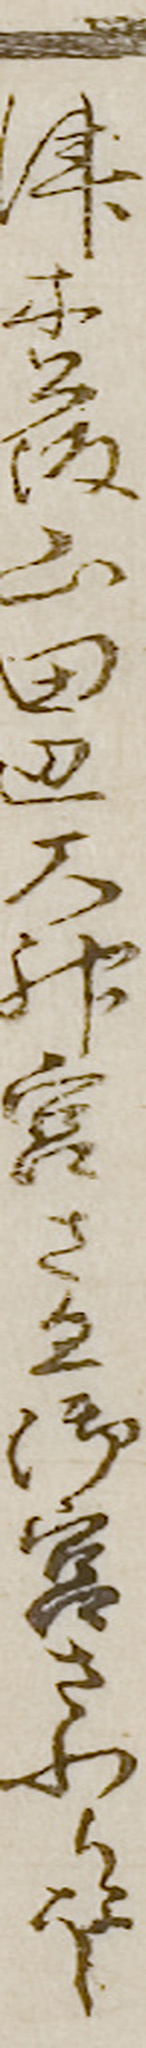津松坂山田辺大神宮さ御宮さふりなし
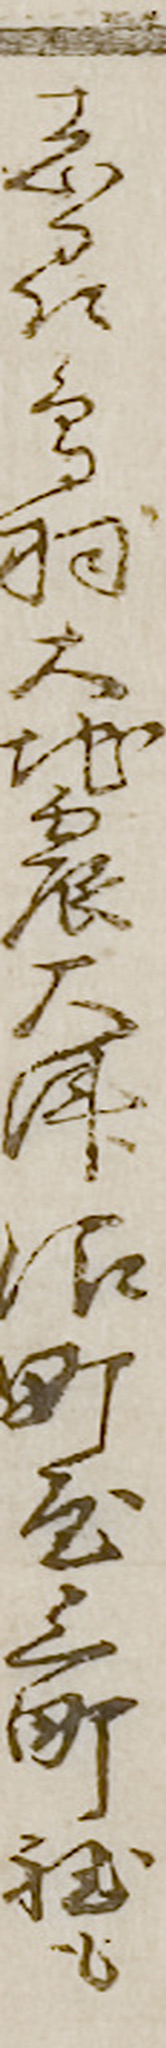志州鳥羽大地震大津浪町屋三町程も
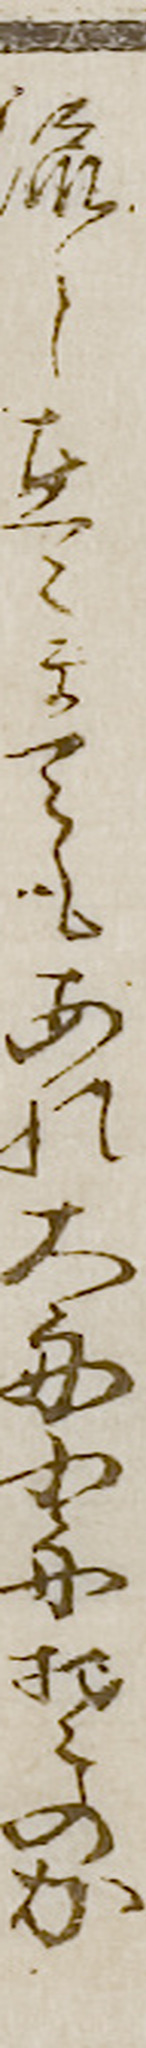流し在々まてもあれ大舟小舟そのか
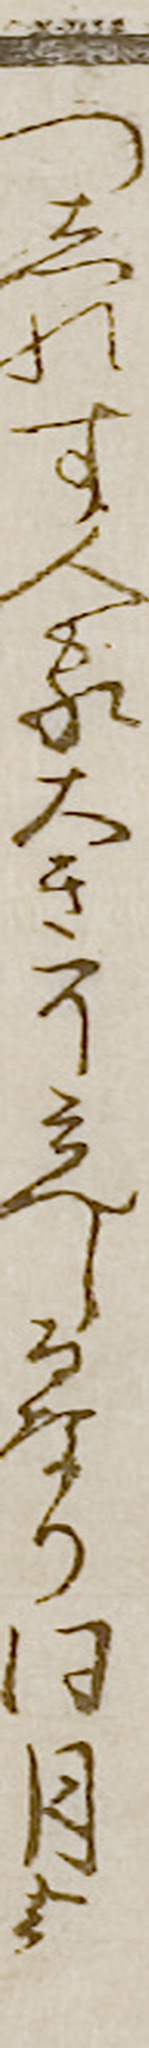つしれす人家大きにそんしるなり同月は
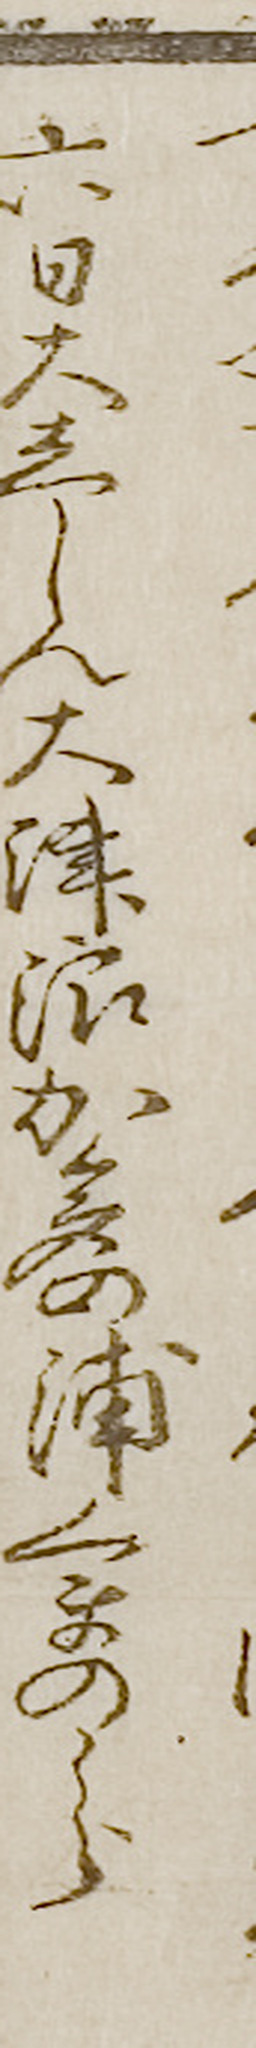六日大しん大津浪かたの浦くまのうら
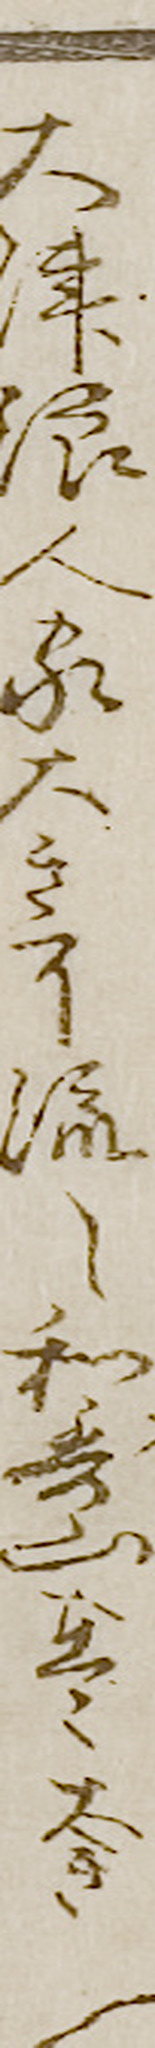大津浪人家大きに流し和哥山在々大き
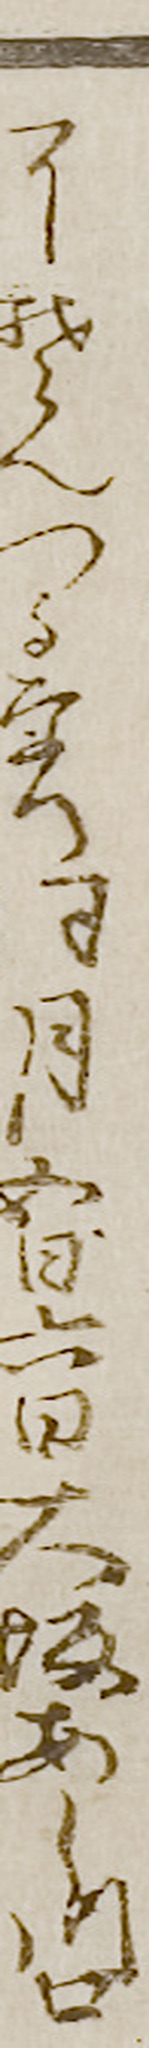にそんつるなり同月五日六日大坂あし川口
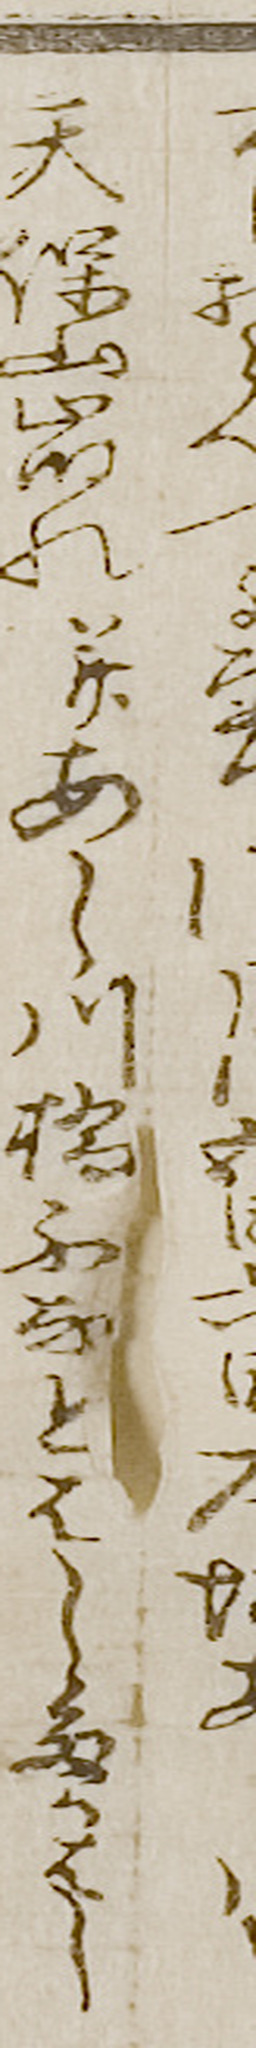天保山崩れ并あし川橋ふなとはしたかはし
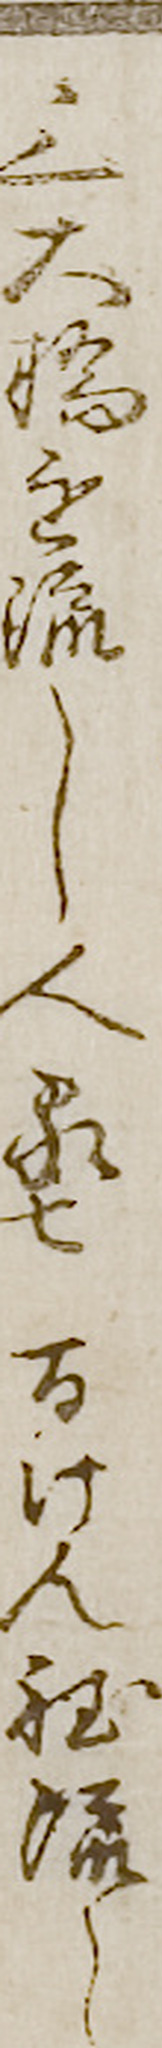三大橋を流し人家七百けん程流し
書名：大地震大津浪太功記十段目秡文句
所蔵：東京大学総合図書館 General Library in the University of Tokyo, JAPAN
